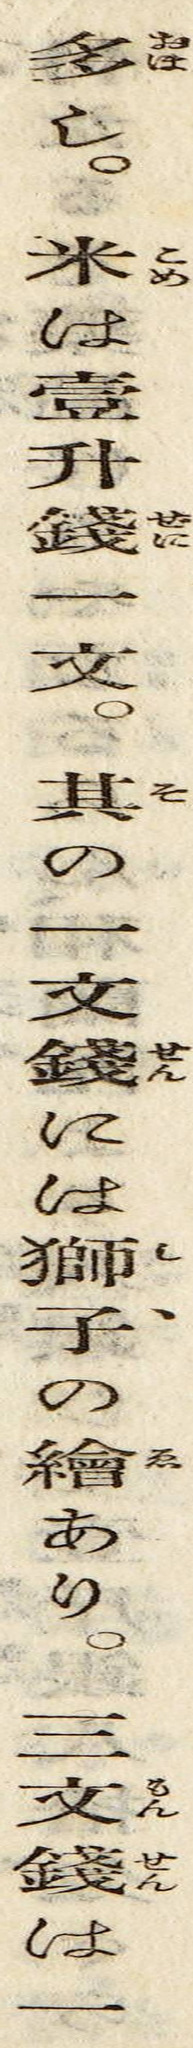多し。米は壱升銭一文。其の一文銭には獅子の絵あり。三文銭は一
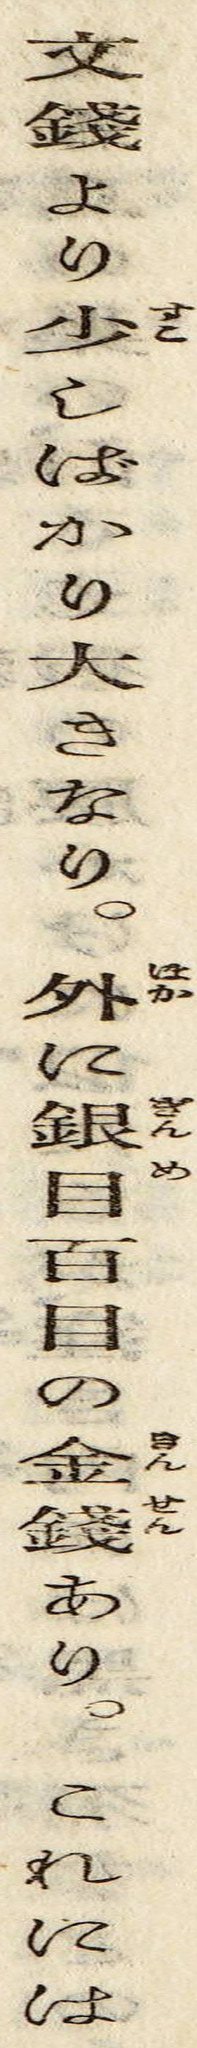文銭より少しばかり大きなり。外に銀目百目の金銭あり。これには
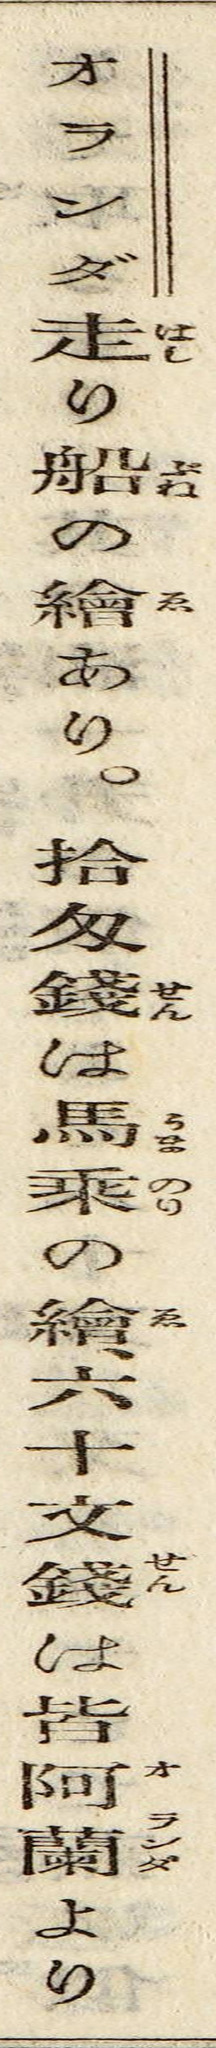オランダ走り船の絵あり。拾匁銭は馬乗の絵、六十文銭は皆阿蘭より
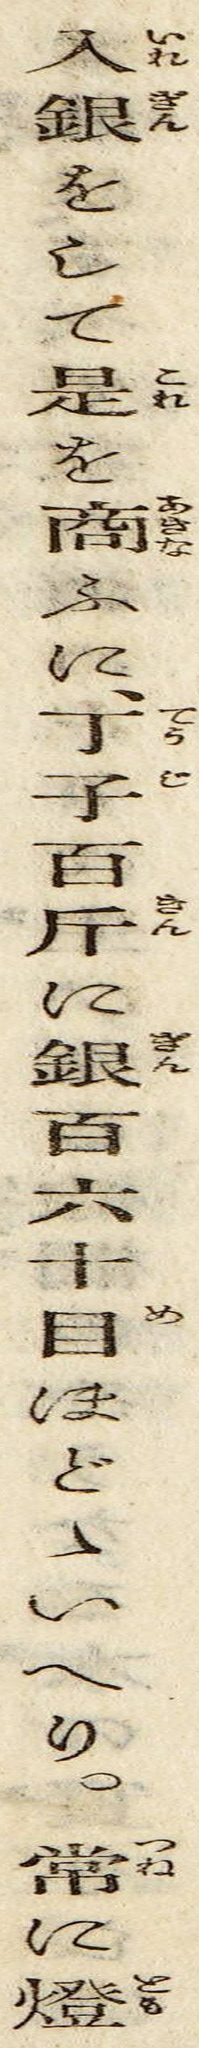入銀をして是を商ふに、丁子百斤に銀百六十目ほどゝいへり。常に灯

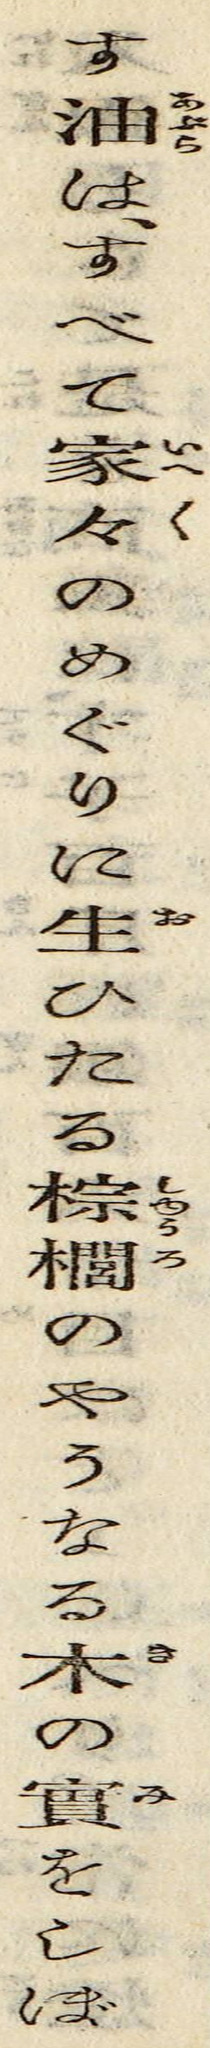す油は、すべて家々のめぐりに生ひたる棕櫚のやうなる木の実をしぼ
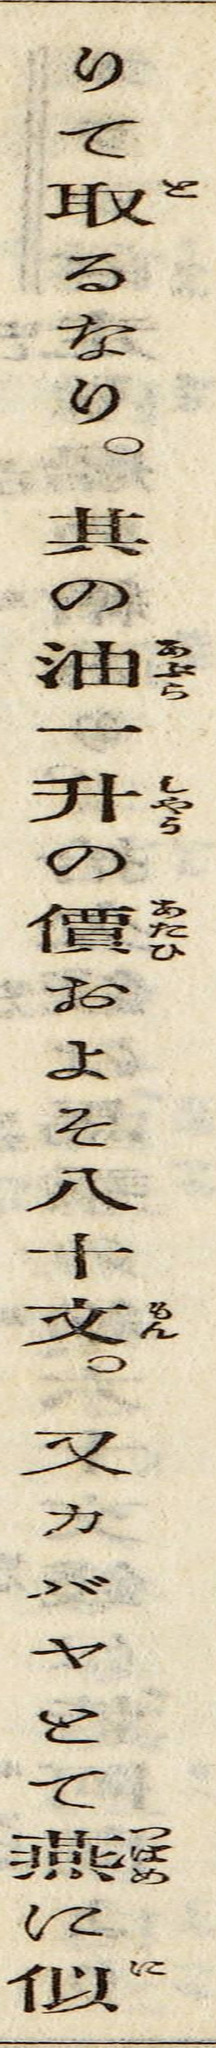りて取るなり。其の油一升の価およそ八十文。又カバヤとて燕に似
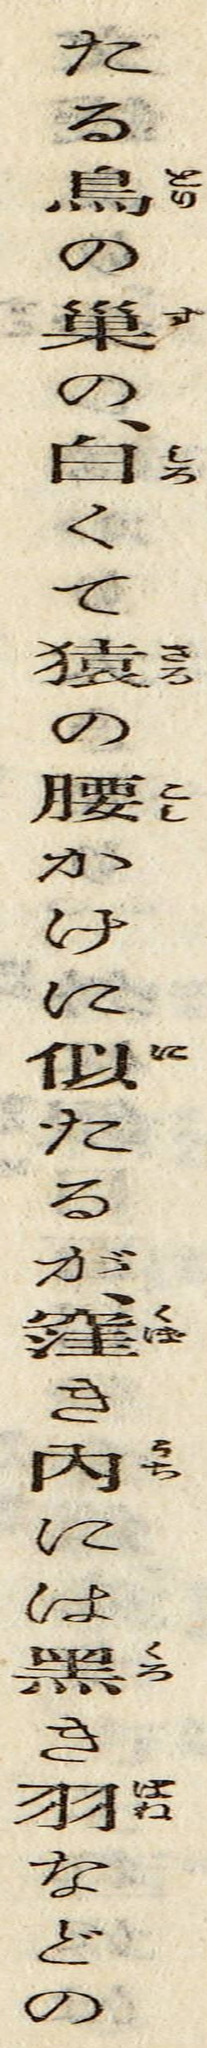たる鳥の巣の、白くて猿の腰かけに似たるが、窪き内には黒き羽ねなどの
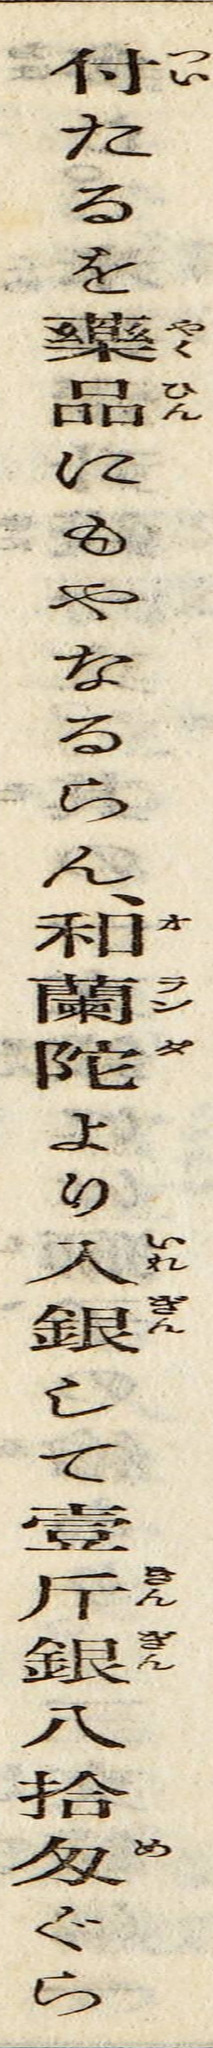付たるを薬品にもやなるらん、和蘭陀より入銀して壱斤銀八拾匁ぐら
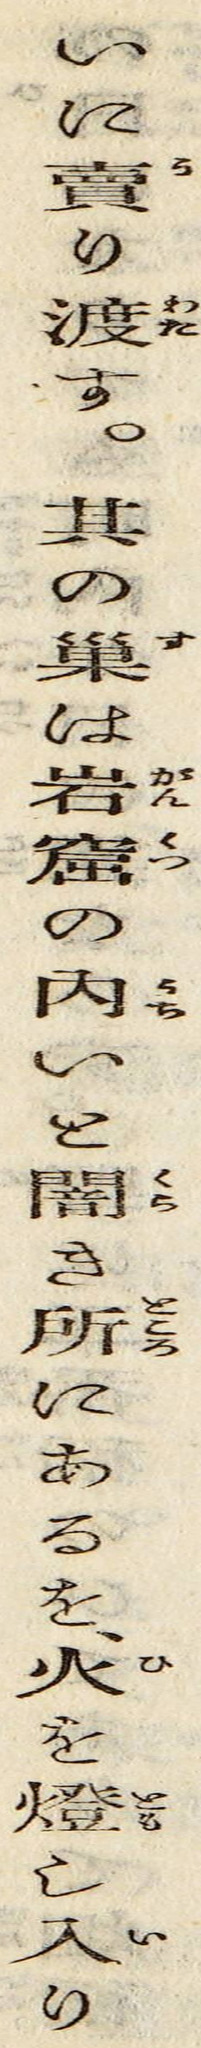いに売り渡す。其の巣は岩窟の内いと闇き所にあるを、火と灯し入り
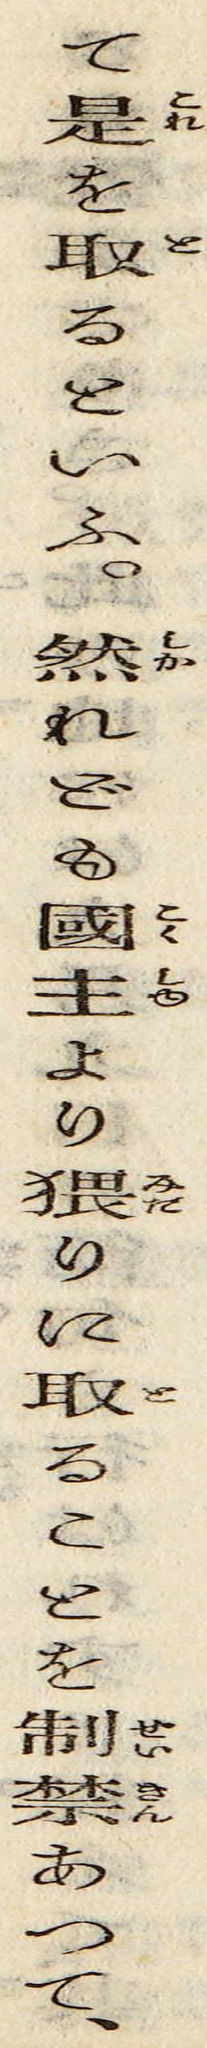て是を取るといふ。然れども国主より猥りに取ることを制禁あつて、
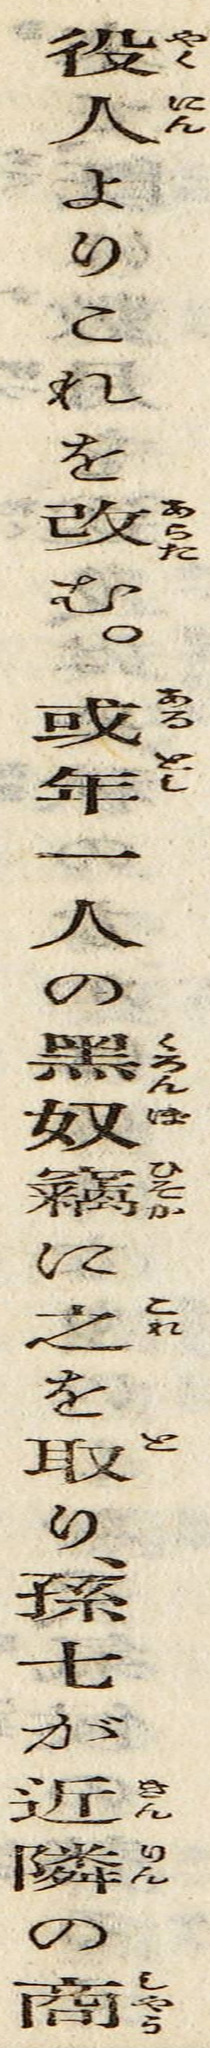役人よりこれを改む。或年一人の黒奴窃に之を取り、孫七が近隣の商
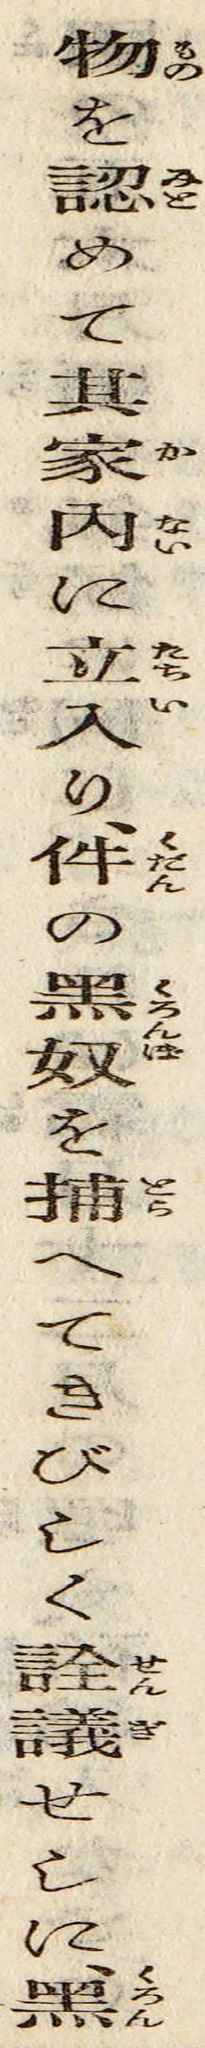物を認めて其家内に立入り、件の黒奴を捕へてきびしく詮議せしに、黒
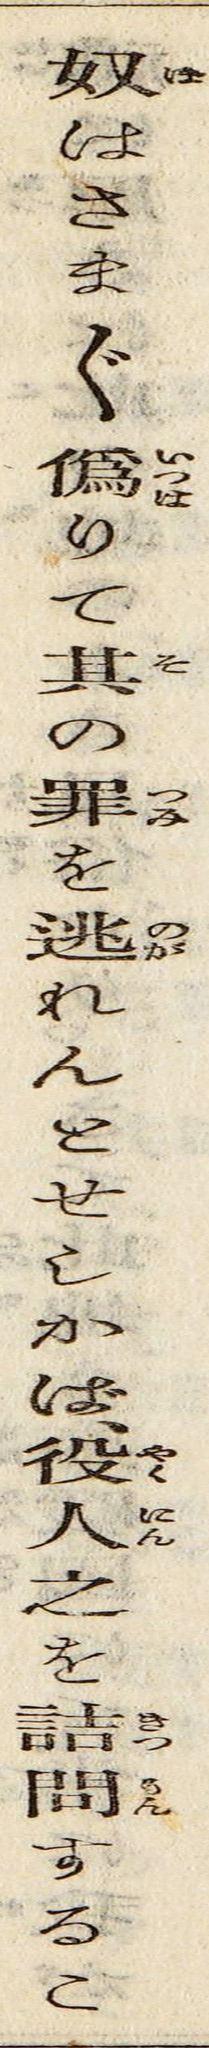奴はさま〴〵偽りて其の罪を逃れんとせしかば、役人之を詰問するこ
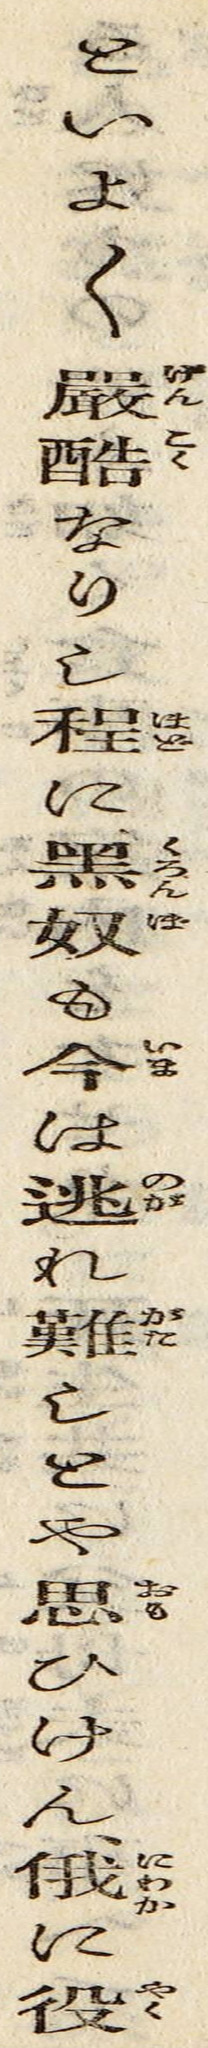といよ〳〵厳酷なりし程に黒奴も今は逃れ難しとや思ひけん、俄に役
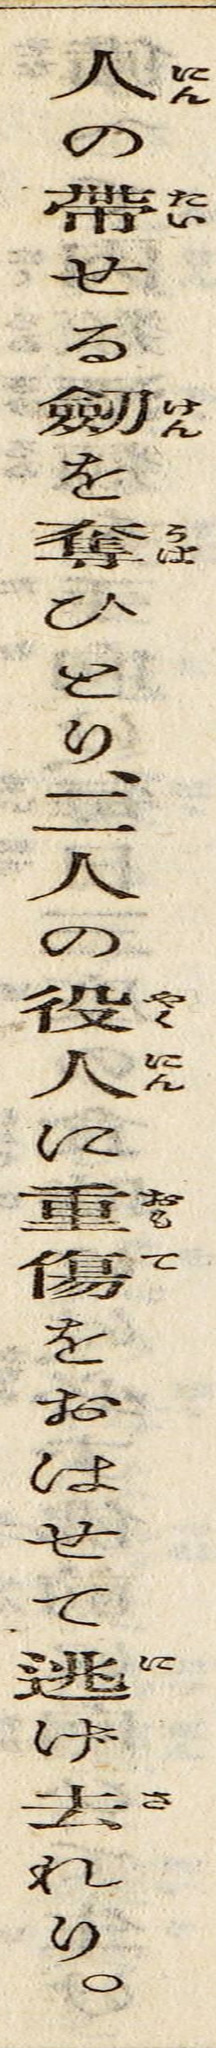人の帯せる剣を奪ひとり、二人の役人に重傷をおはせて逃げ去れり。
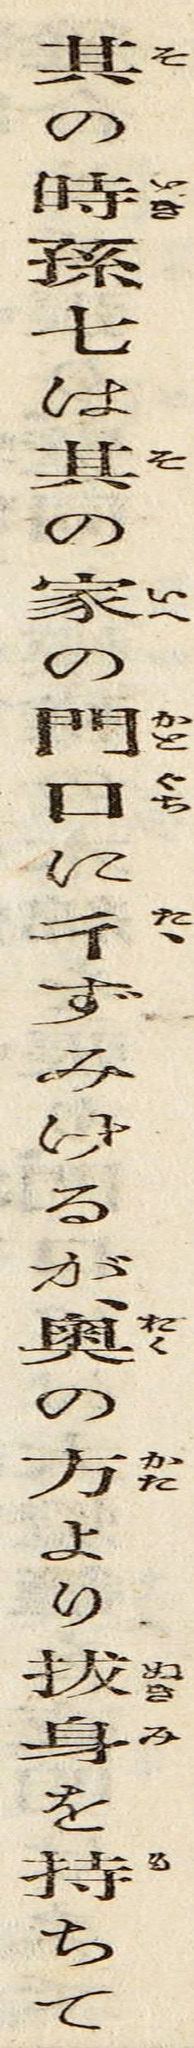其の時孫七は其の家の門口に彳ずみけるが、奥の方より抜身を持ちて
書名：日本漂流譚
